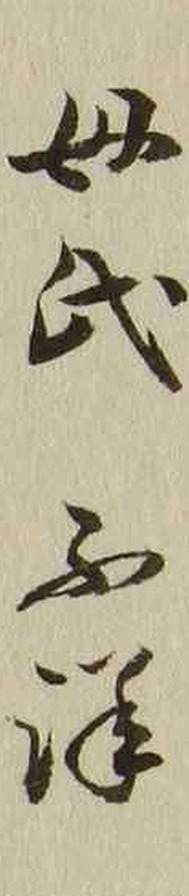女氏不詳
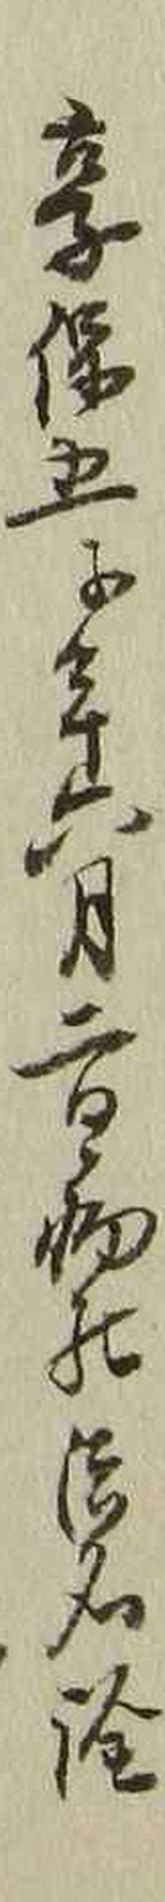一享保五子年六月十四日病死法名寿
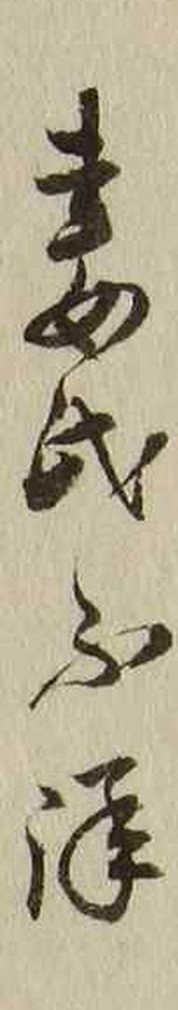女氏不詳
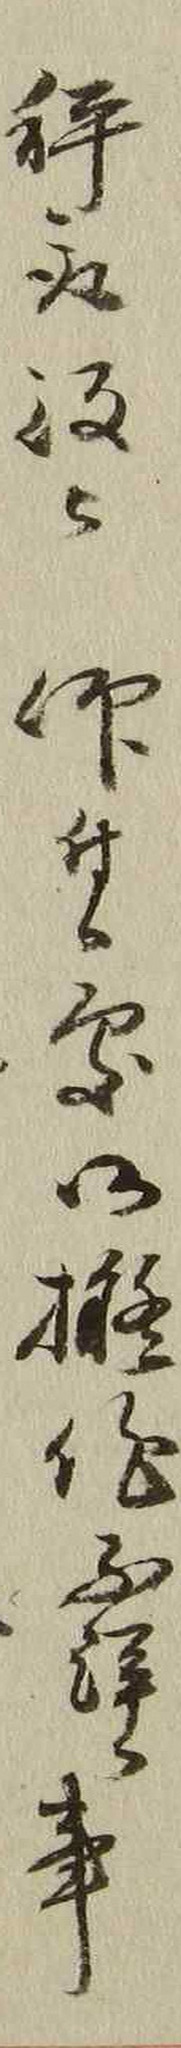秤取役被仰付候処御擬作不詳候事
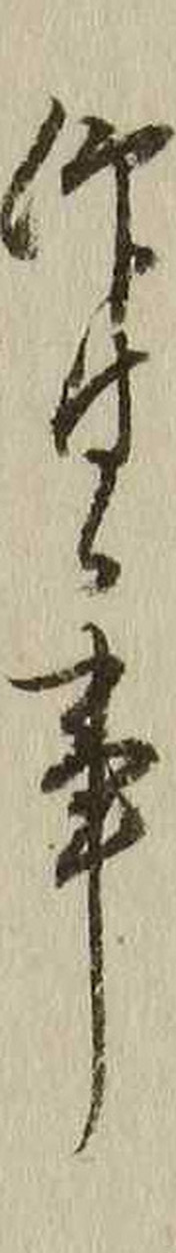仰付候事
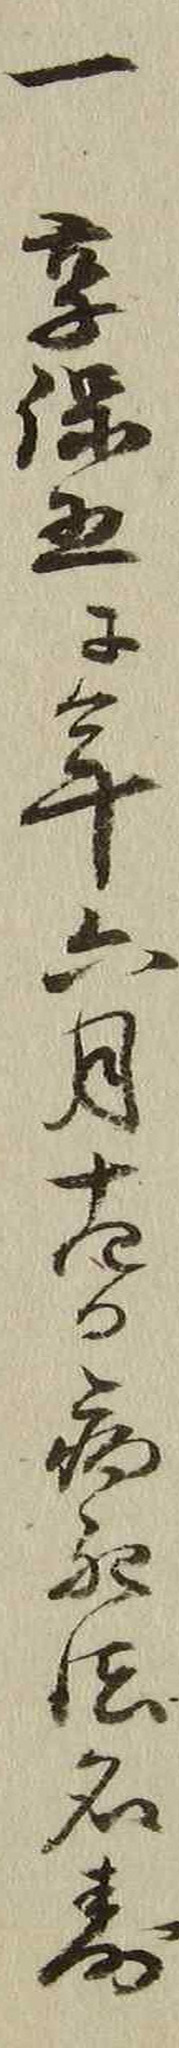一享保五子年六月十四日病死法名寿
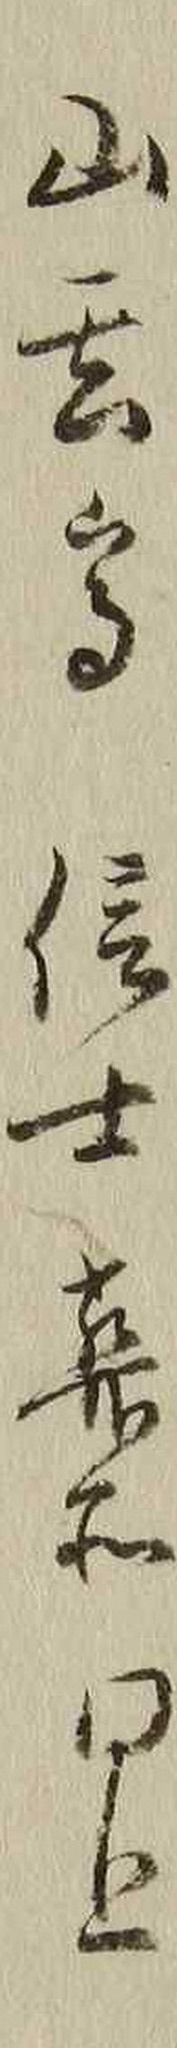山玄高信士葬所同上
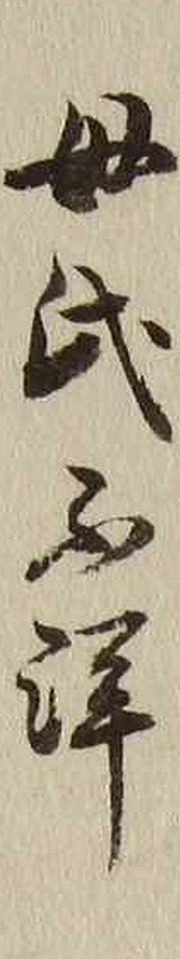女氏不詳
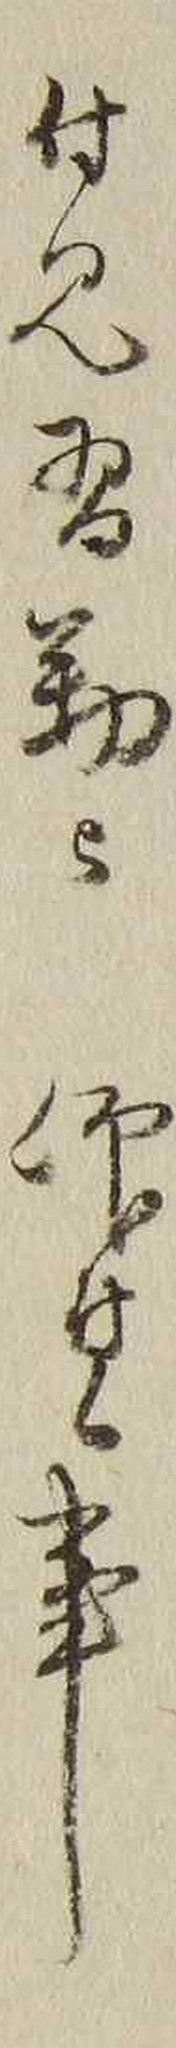付見習勤被仰付候事

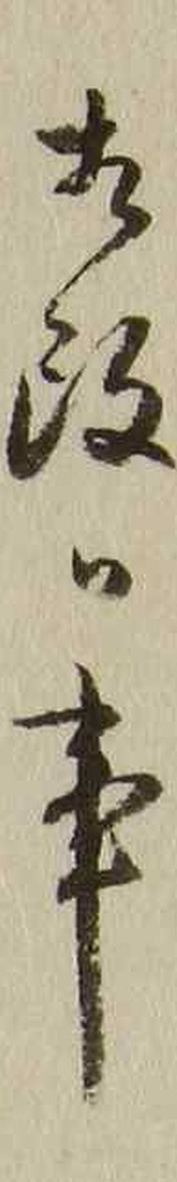相改候事
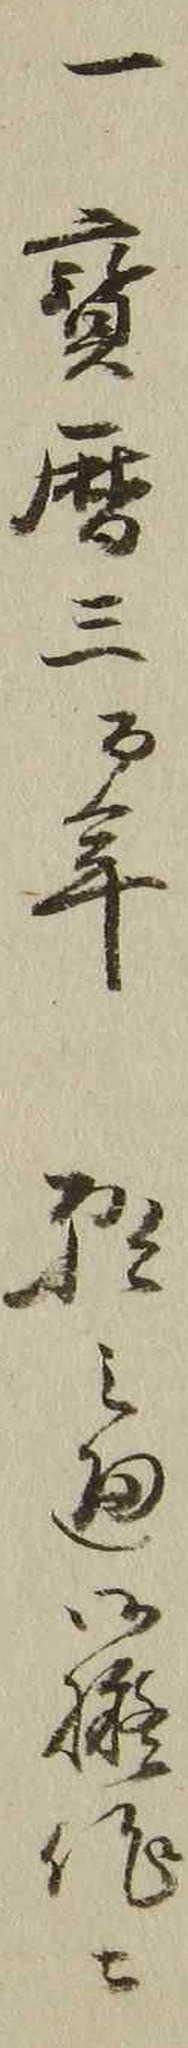一宝暦三酉年願之通御擬作被
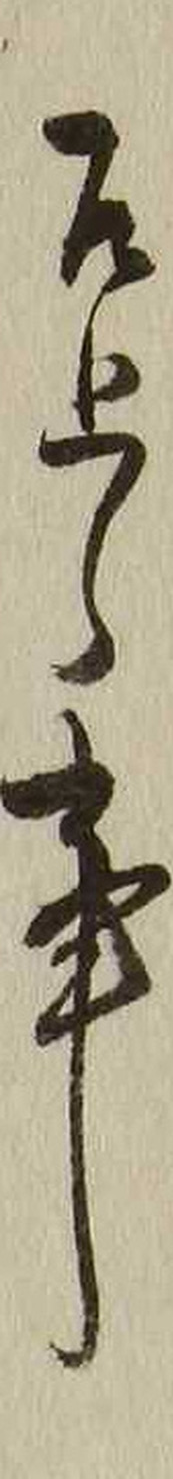召上候事
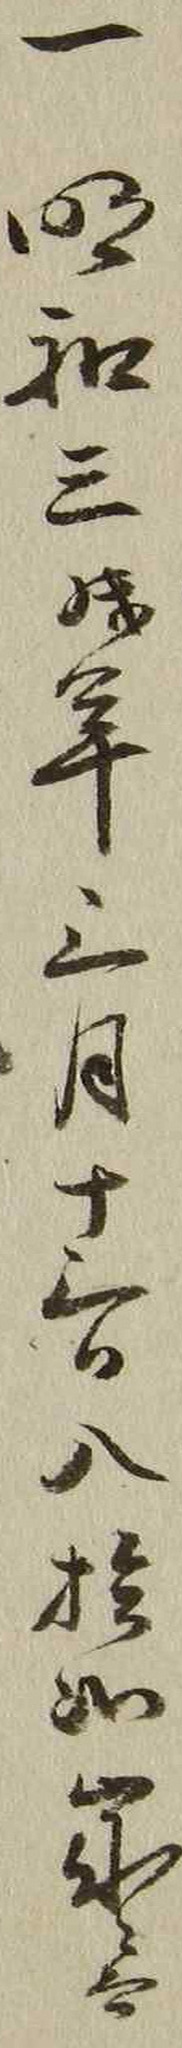一明和三戌年三月十三日八拾弐歳ニ而
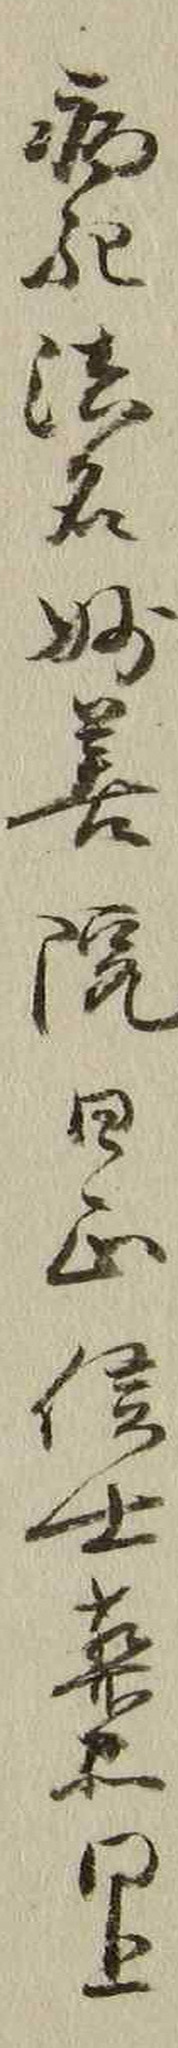病死法名妙善院日正信士葬所同上
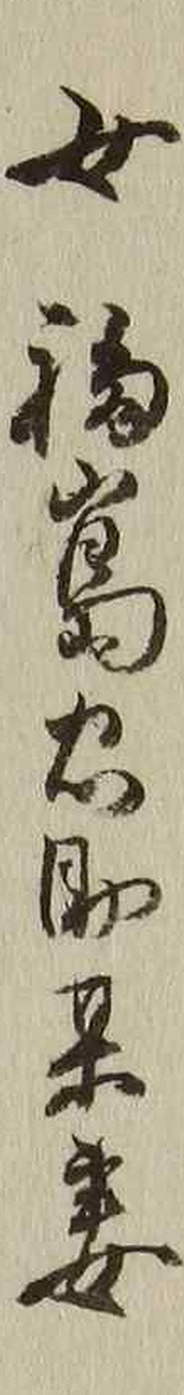女福島忠助某妻
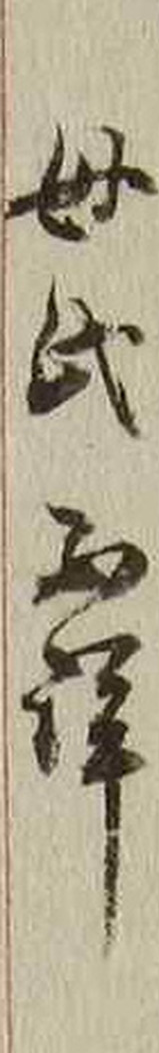母氏不詳
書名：諸士系譜　巻之236　ふ之部4
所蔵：会津若松市立会津図書館
